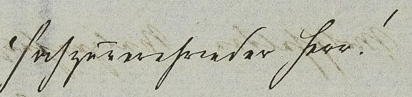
Hochzuverehrender Herr!
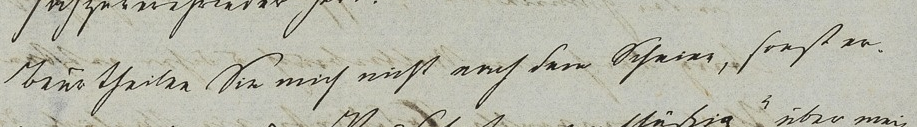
Beurtheilen Sie mich nicht nach dem Scheine, sonst er-
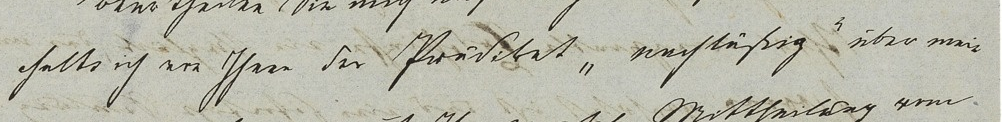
halte ich von Ihnen das Prädikat «nachläßig» über mein
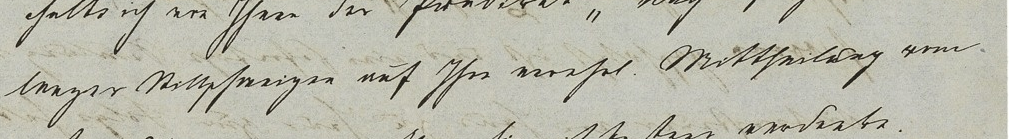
langes Stillschweigen auf Ihre verehrl. Mittheilung vom
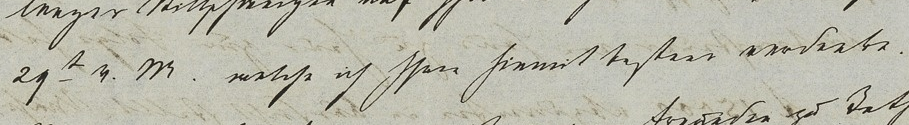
29ten v. M. welche ich Ihnen hiemit bestens verdanke.
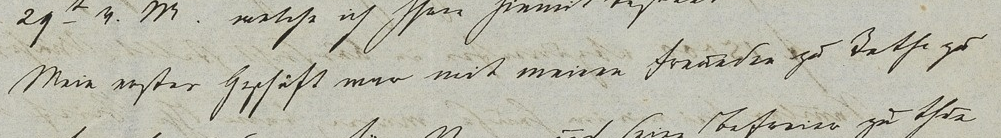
Mein erstes Geschäft war mit meinen Freunden zu Rathe zu
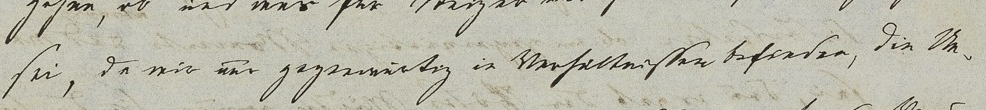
sei, da wir uns gegenwärtig in Verhältnissen befinden, die Ue-
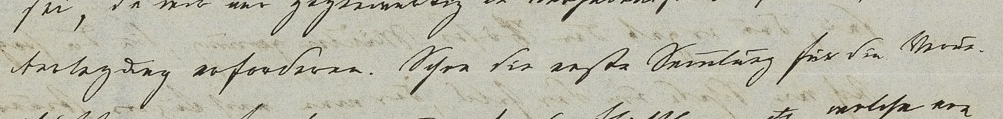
berlegung erforderen. Schon die erste Sammlung für die Verun-
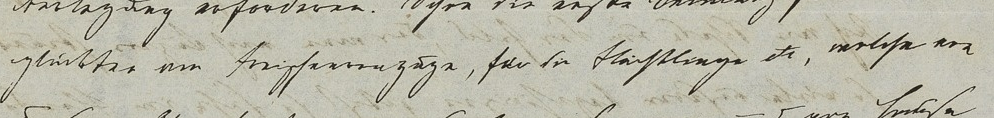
glückten am Freischaarenzuge, für die Flüchtlinge etc, welche von
